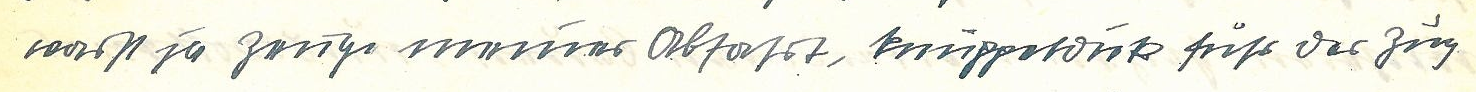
warst ja Zeuge meiner Abfahrt, knüppeldick fuhr der Zug
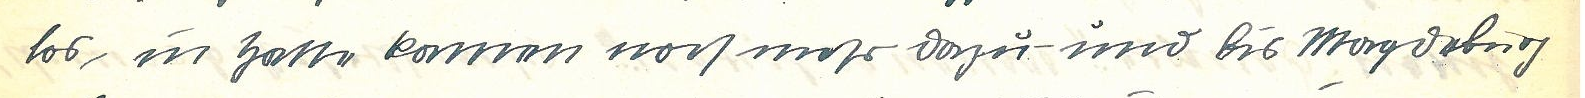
los, in Halle kamen noch mehr dazu – und bis Magdeburg
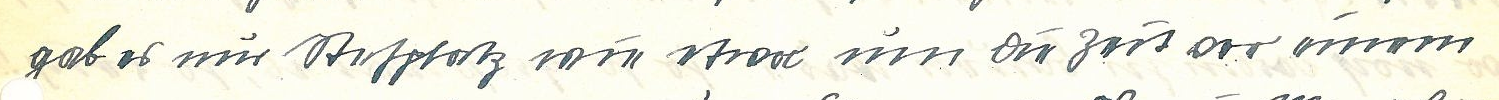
gab es nur Stehplatz wie etwa um die Zeit vor einem
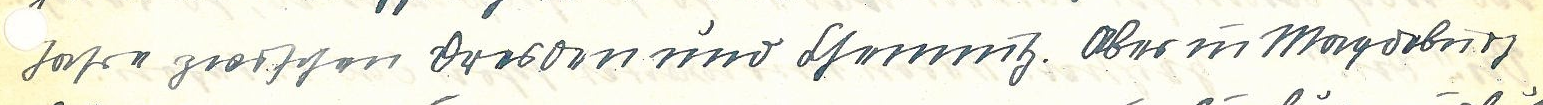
Jahre zwischen Dresden und C. Aber in Magdeburg
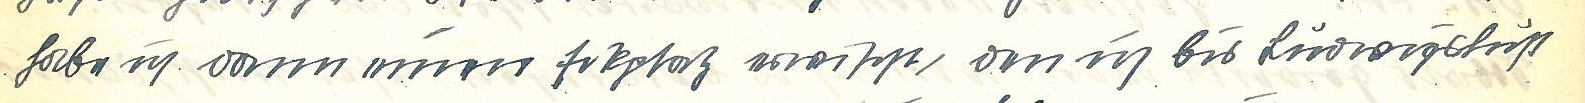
habe ich dann einen Sitzplatz erwischt, den ich bis Ludwigslust
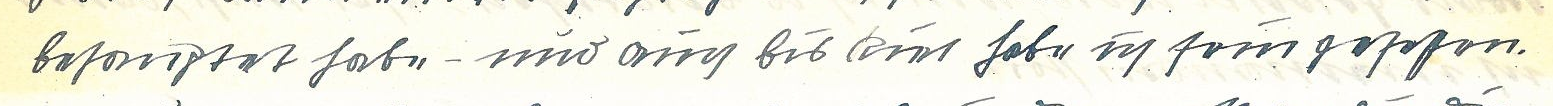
behauptet habe – und auch bis Kiel habe ich fein gesessen.
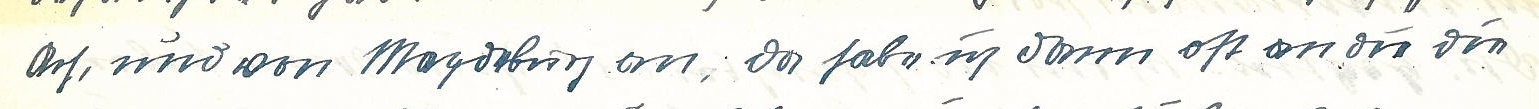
Ach, und von Magdeburg an, da habe ich dann oft an die die
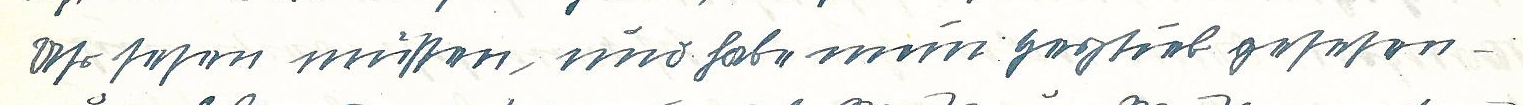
Uhr sehen müssen, und habe mein Herzlieb gesehen –
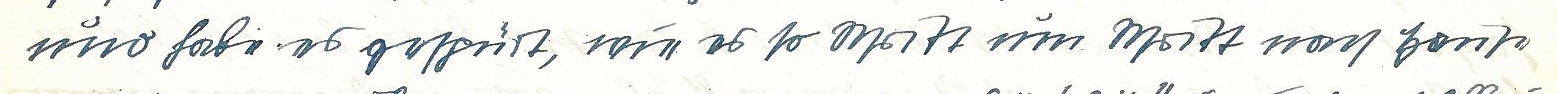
und habe es gespürt, wie es so Schritt um Schritt nach Hause¬
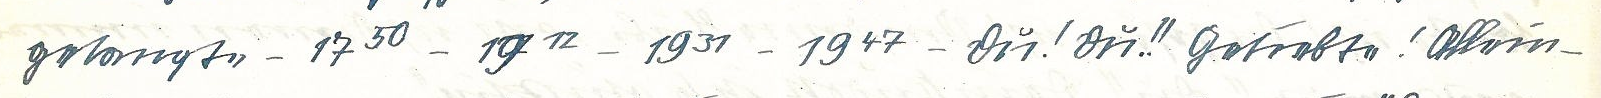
gelangte – 1750 – 1912 – 1930 – 1947 – Du! Du!! Geliebte!! Allein –
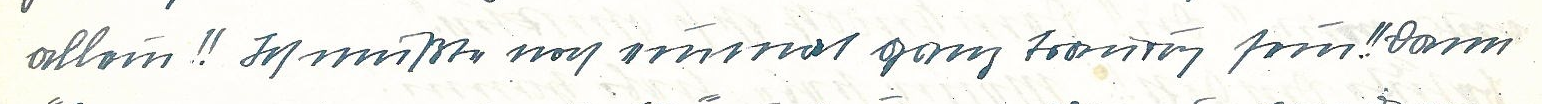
allein!! Ich mußte noch einmal ganz traurig sein!! Dann
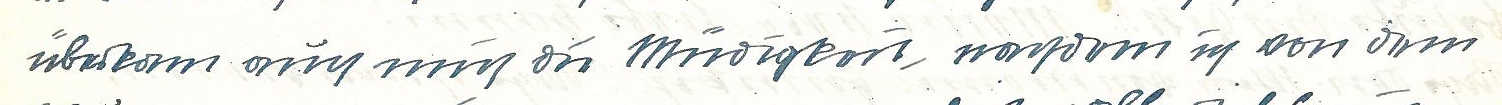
überkam auch mich die Müdigkeit, nachdem ich von dem
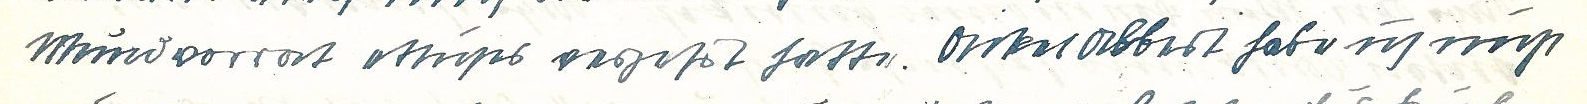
Mundvorrat etliches verspeist hatte. Onkel A. habe ich nicht
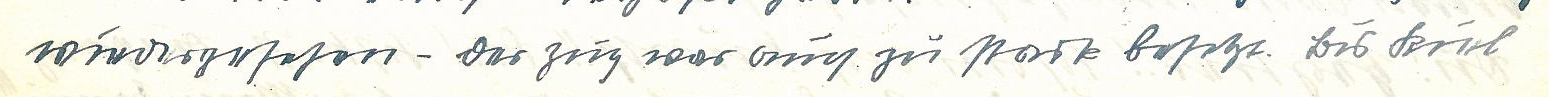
wiedergesehen – der Zug war auch zu stark besetzt. Bis Kiel
